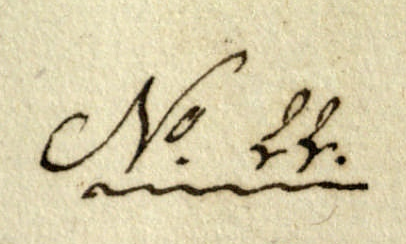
N 22.
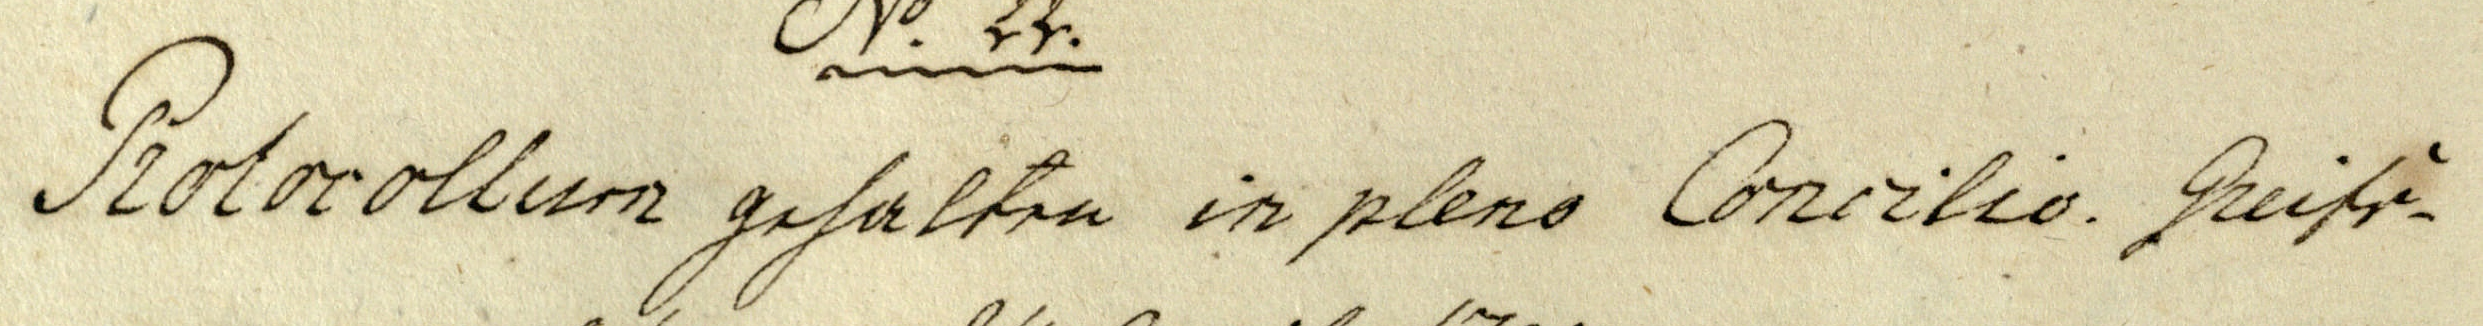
Protocollum gehalten in pleno Concilio Greifs¬
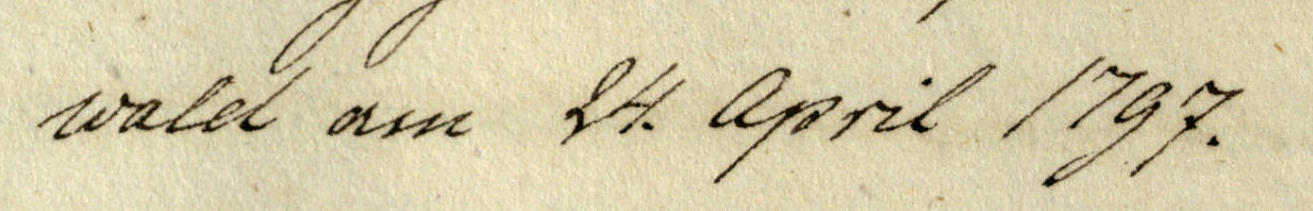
wald am 24. April 1797.
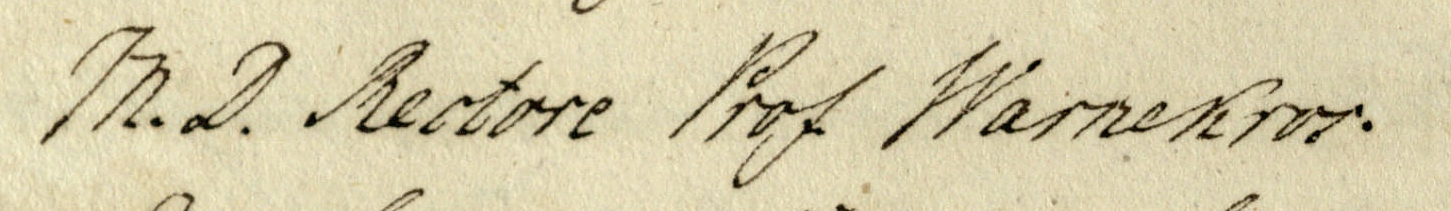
M. D. Rectore Prof. Warnekros.
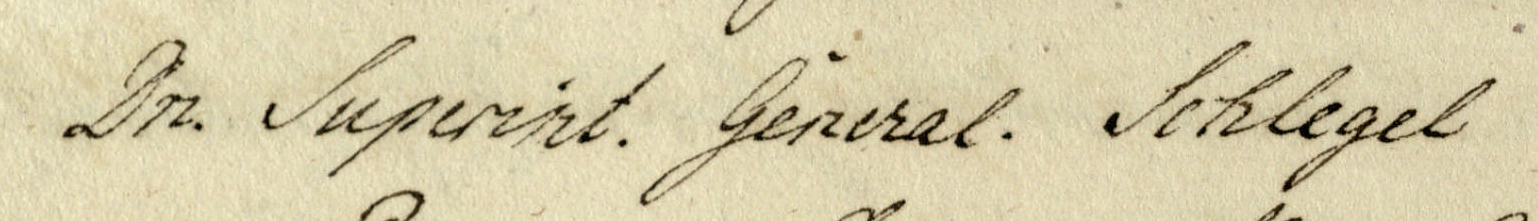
Dn. Superint. General. Schlegel
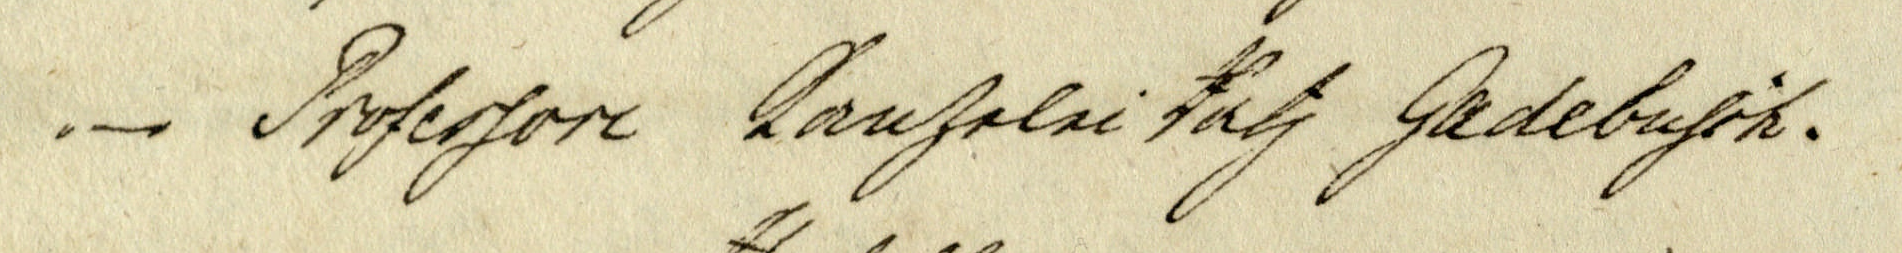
Professore Kanzelei Rath Gadebusch.
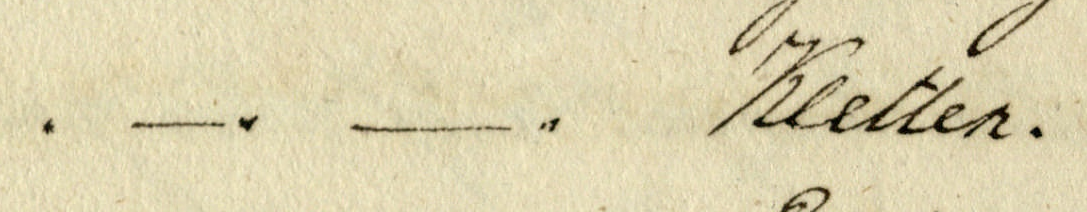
Kletten.
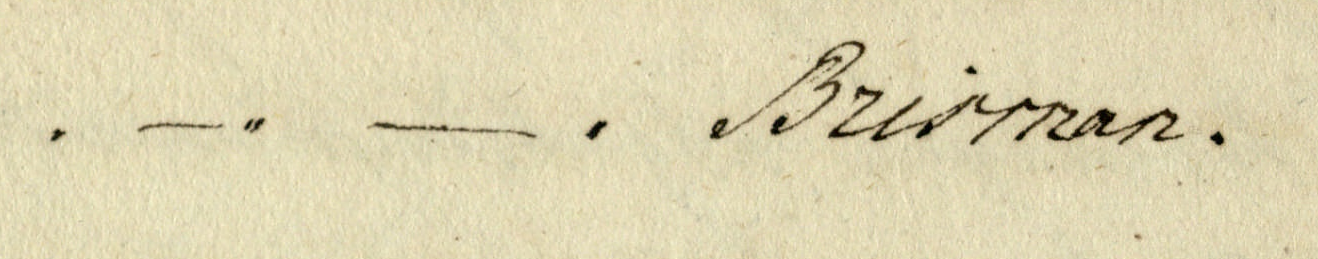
Brisman.
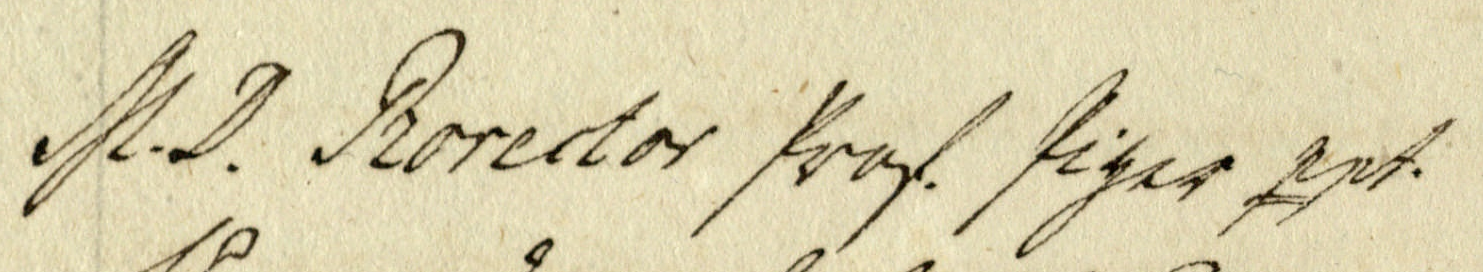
M. D. Prorector Prof. Piper ppt.
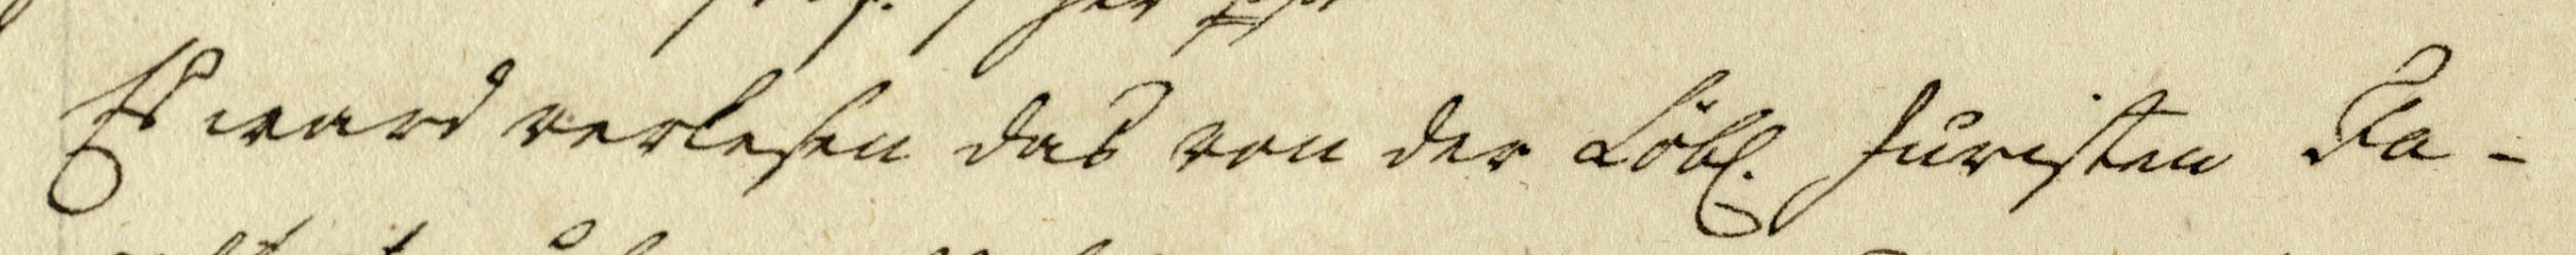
Es ward verlesen das von der Löbl. Juristen Fa¬
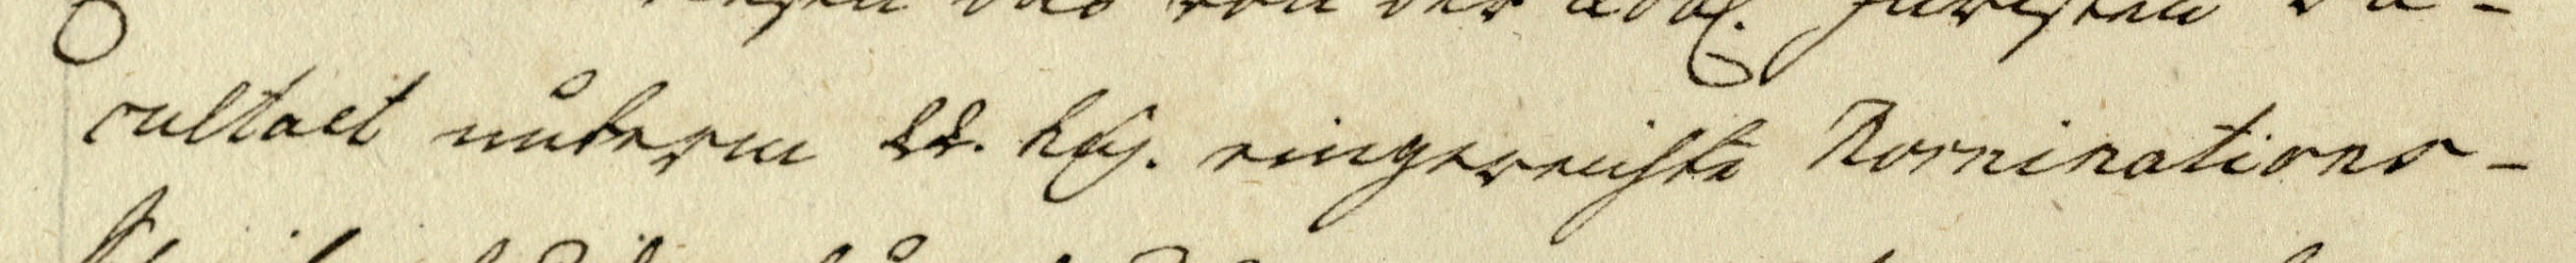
cultaet unterm 22. huj. eingereichte Nominations
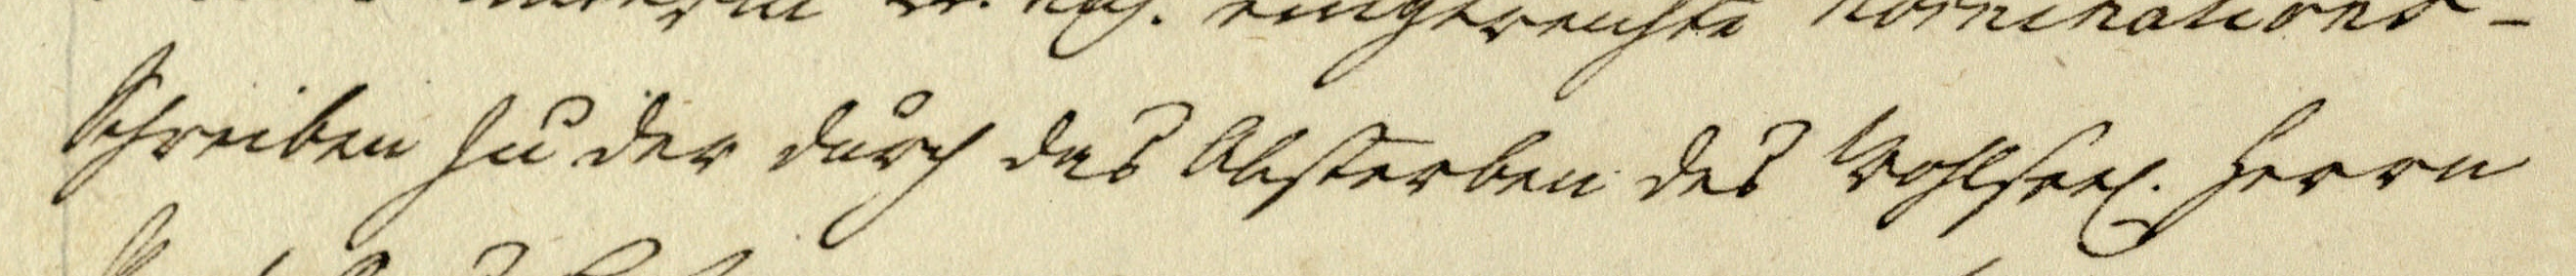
Schreiben zu der durch das Absterben des Wohlseel. Herrn
